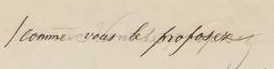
comme vous le proposez
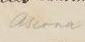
serait
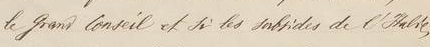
le Grand Conseil et si les subsides de l'Italie,
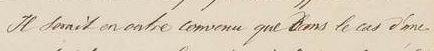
Il serait en outre convenu que dans le cas d'une
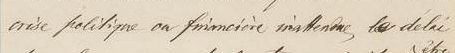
crise politique ou financière inattendue, le délai
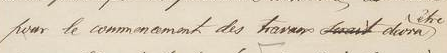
pour le commencement des travaux serait devra être
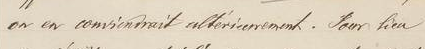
on en conviendrait ultérieurement. Pour lieu
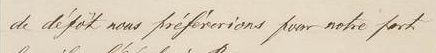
de dépôt nous préférerions pour notre part
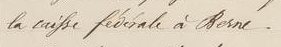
la caisse fédérale à Berne.
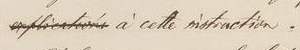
explications à cette instruction.
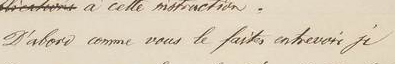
D'abord comme vous le faites entrevoir je
